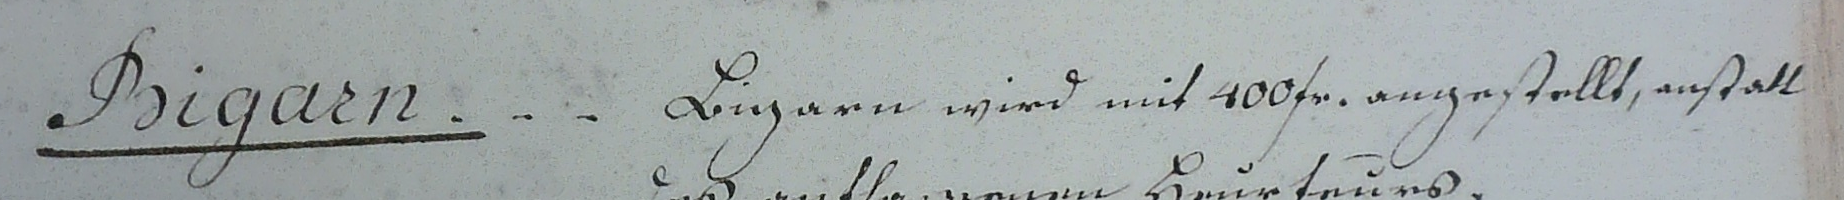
Bigarn . .. .. Bigarn wird mit 400fr.angestellt, anstatt
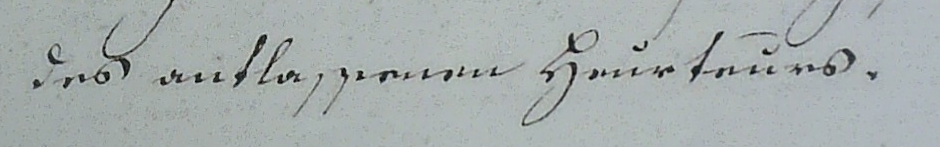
des entlassenen Heurteurs.
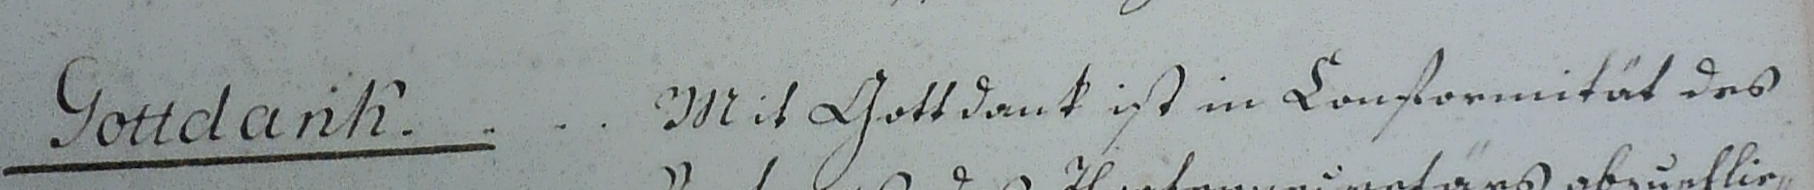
Gottdank. .. .. .. Mit Gottdank ist in Conformität des
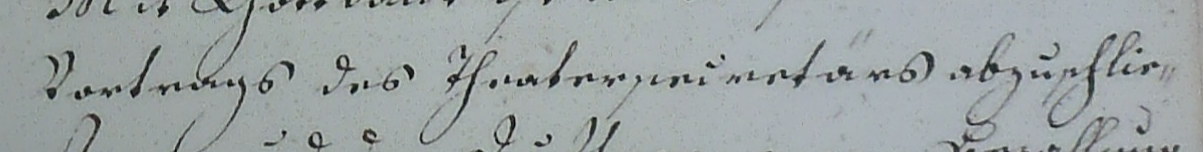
Vortrags des Theatersecretärs abzuschlie¬
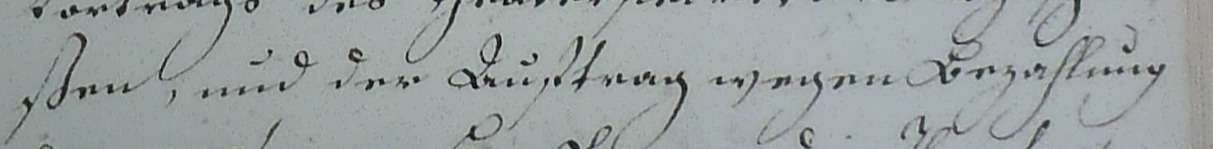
ßen, und der Auftrag wegen Bezahlung
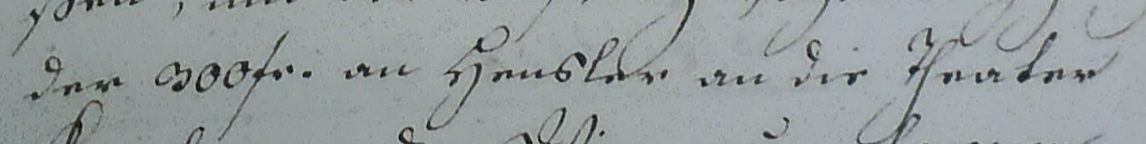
der 300fr. an Hensler an die Theater
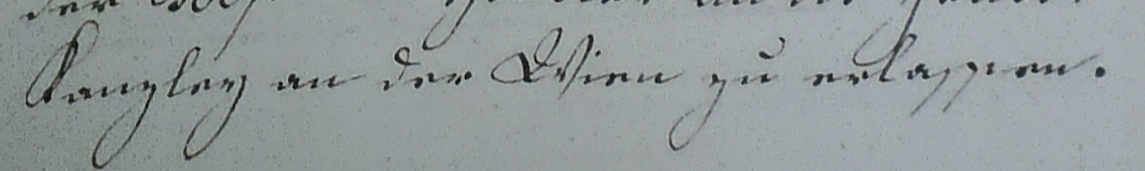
Kanzley an der Wien zu erlassen.
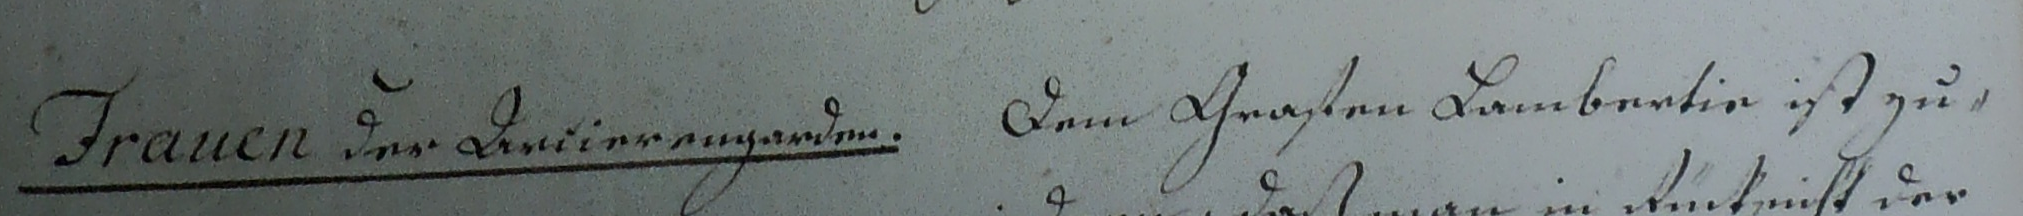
Frauen der Arcierengarden. Dem Grafen Lambertie ist zu¬
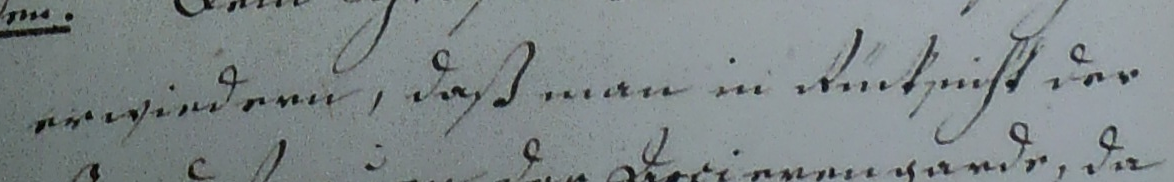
erwiedern, daß man in Rücksicht der
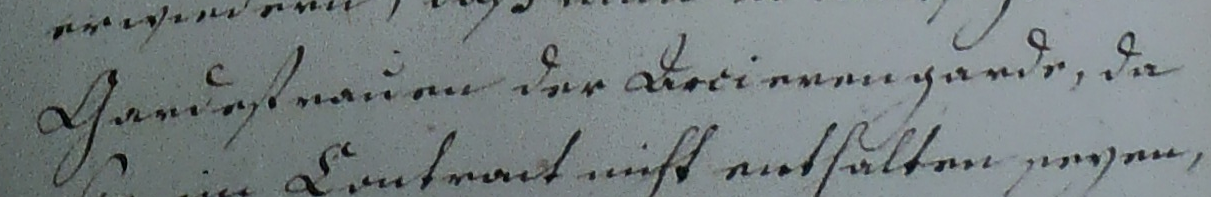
Gardefrauen der Arcierengarde, da
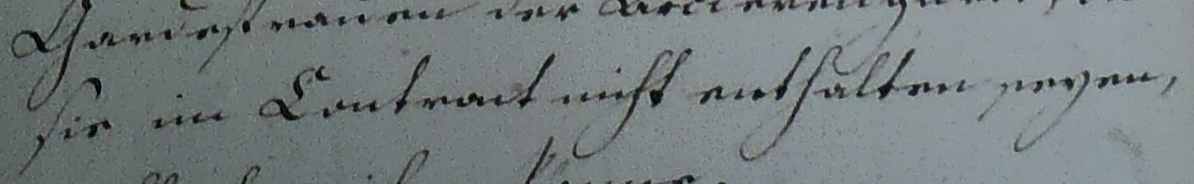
sie in Contract nicht enthalten seyen,
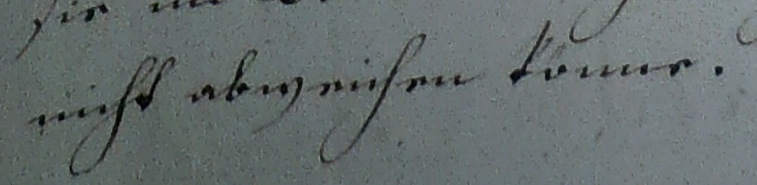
nicht abweichen könne.
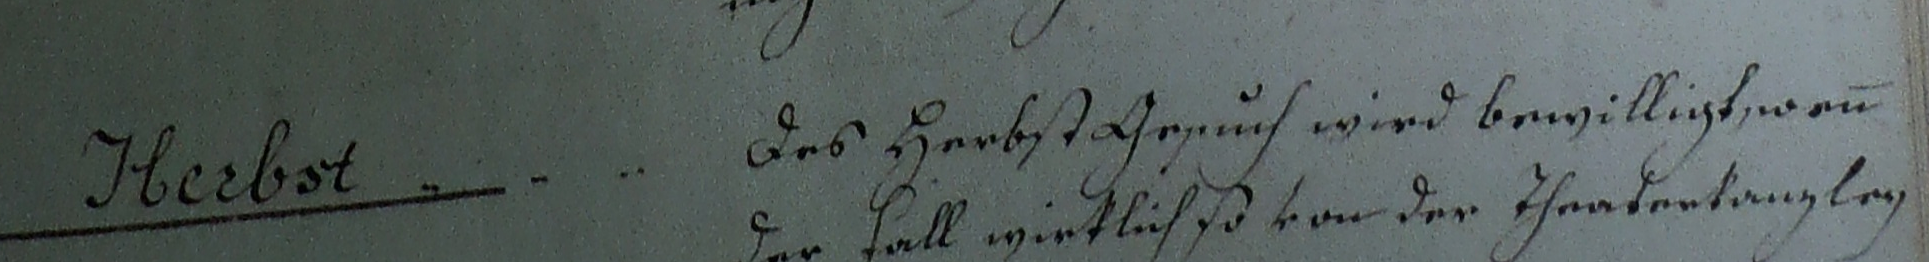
Herbst .. .. .. Des Herbst Gesuch wird bewilligt, wen̄
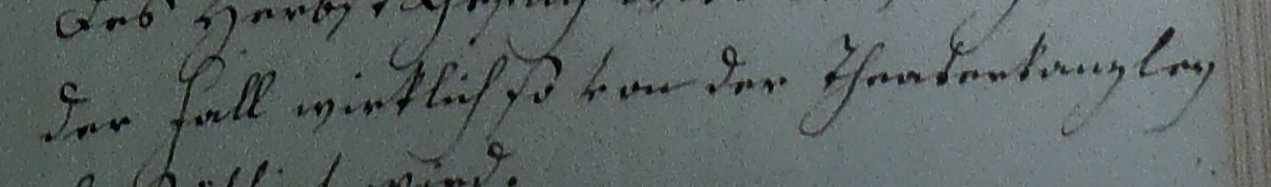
der Fall wirklich so von der Theaterkanzley
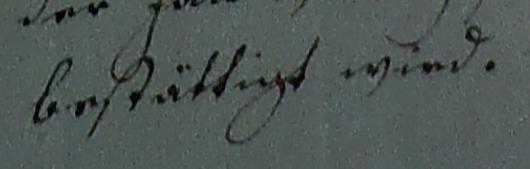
bestättigt wird.
